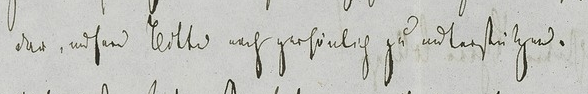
dar, unsere Bitte noch persönlich zu unterstützen.
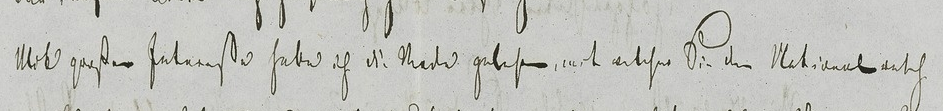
Mit großem Interesse habe ich die Rede gelesen, mit welcher Sie den Nationalrath
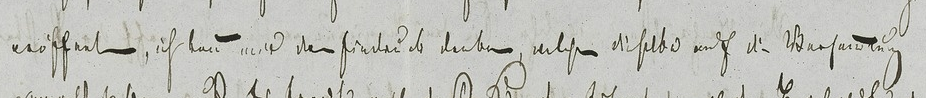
eröffneten, ich kann mir den Eindruck denken, welchen dieselbe auf die Versammlung
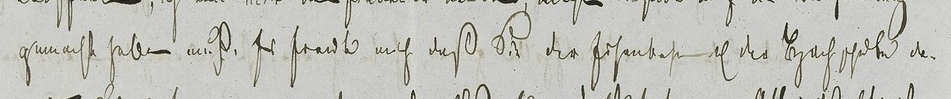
gemacht haben muß. Es freute mich daß Sie der Eisenbahn & der Hochschule da-
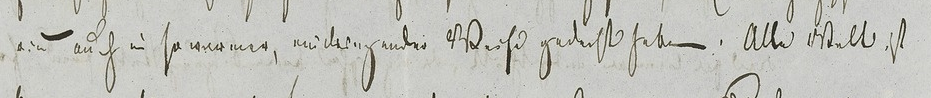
rin auch in so warmer, eindringender Weise gedacht haben. Alle Welt ist
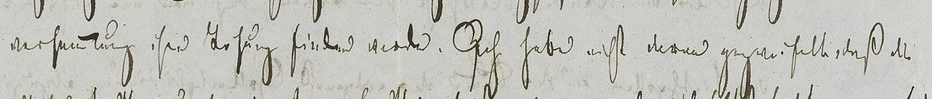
versammlung ihre Lösung finden werde. Ich habe nicht daran gezweifelt, daß die
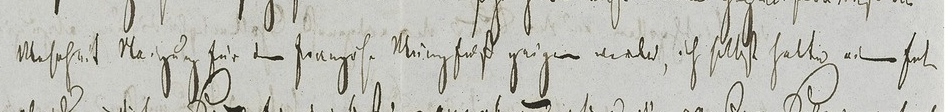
Neigung für denfranzös. Münzfuß zeigen werde, ich selbst halte
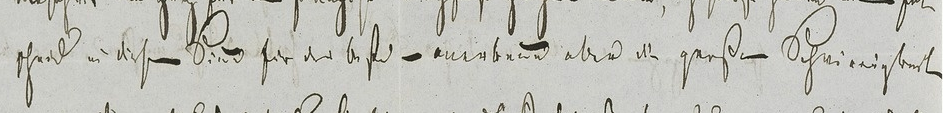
scheid in diesem Sinne für das beste – anerkenne aber die großen Schwierigkeiten
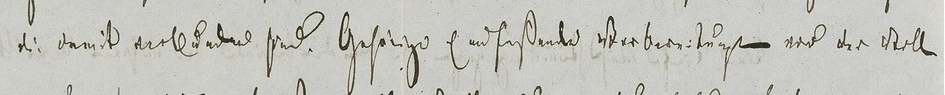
die damit verbunden sind. Gehörige & umfassende Vorbereitungen vor der Voll-
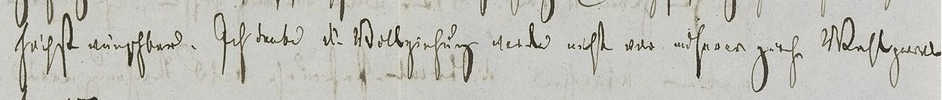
höchst wünschbar. Ich denke die Vollziehung werde nicht vor unserer
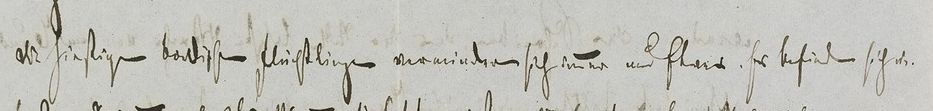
Die hießigen badischen Flüchtlinge vermindern sich immer um Etwas. Es befinden sich in
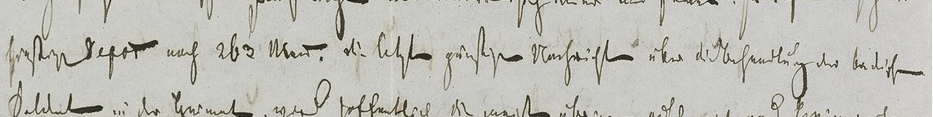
hießigem Depot noch 263 Mann. Die letzte günstige Nachrichten über die Behandlung der badischen
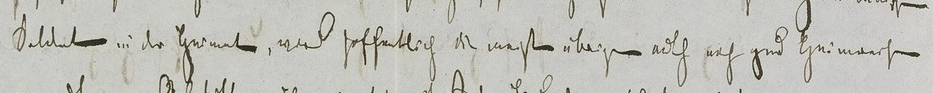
Soldaten in der Heimat, wird hoffentlich die meisten übrigen auch noch zur Heimreise
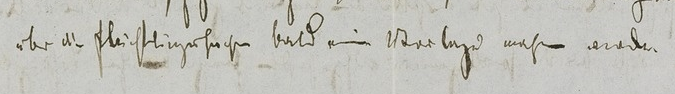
über die Flüchtlingsfragen bald eine Vorlage machen werde.
